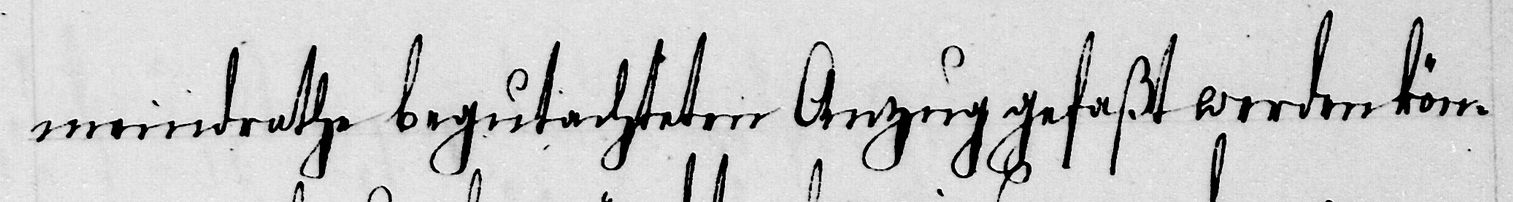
meindrathe begutachteten Anzug gefaßt werden kön¬
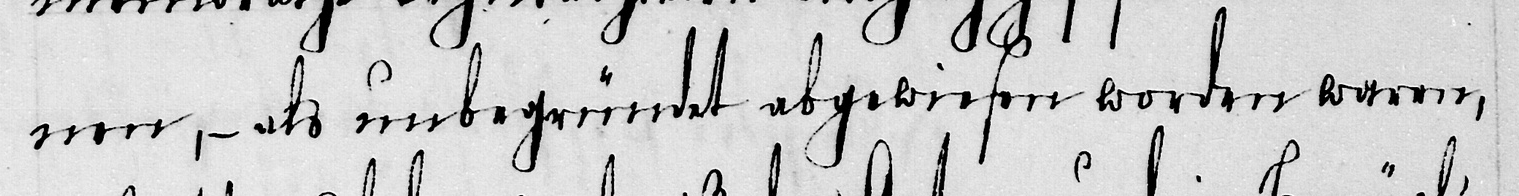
nen, – als unbegründet abgewiesen worden waren,
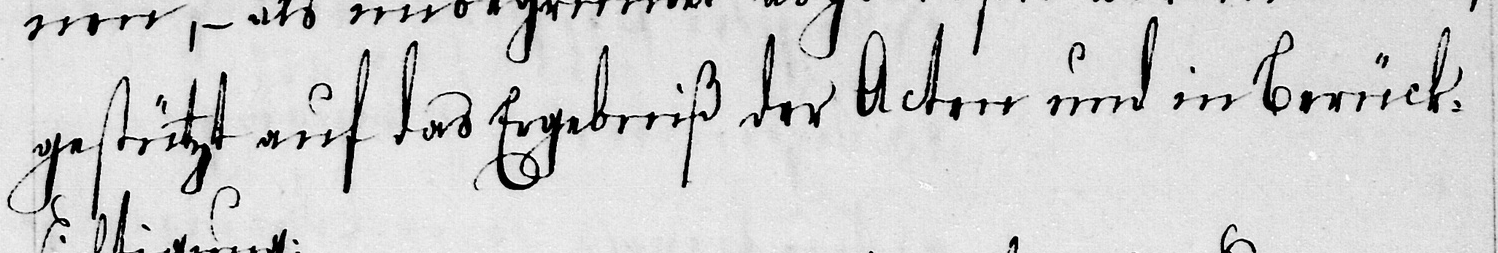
gestützt auf das Ergebniß der Acten und in Berück¬
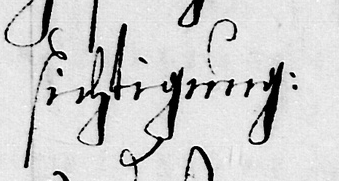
sichtigung:
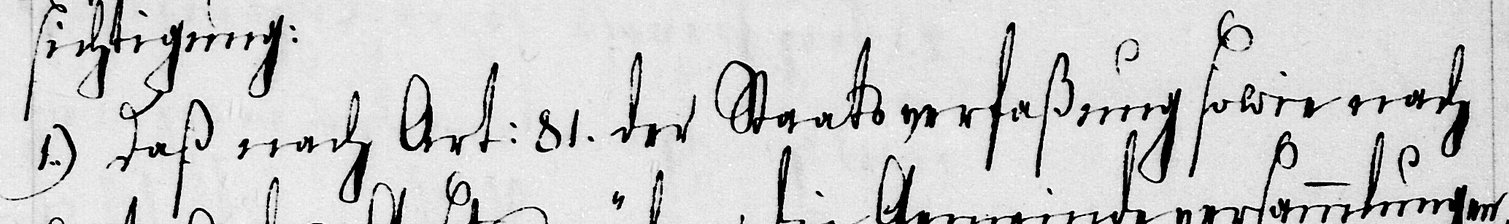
1.) Daß nach Art: 81. der Staatsverfaßung sowie nach
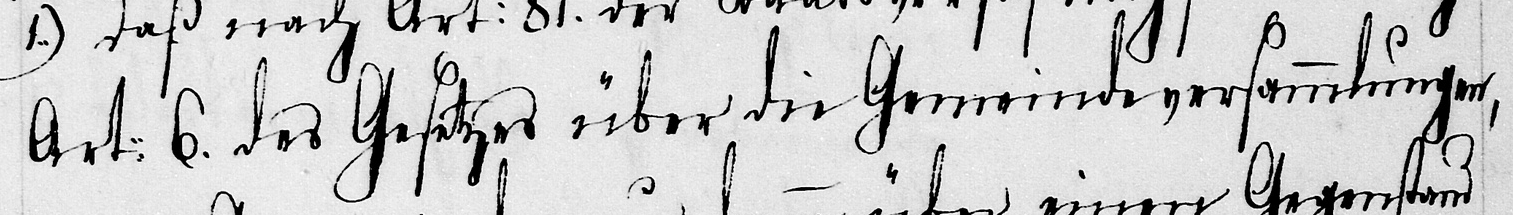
Art: 6. des Gesetzes über die Gemeindeversammlungen,
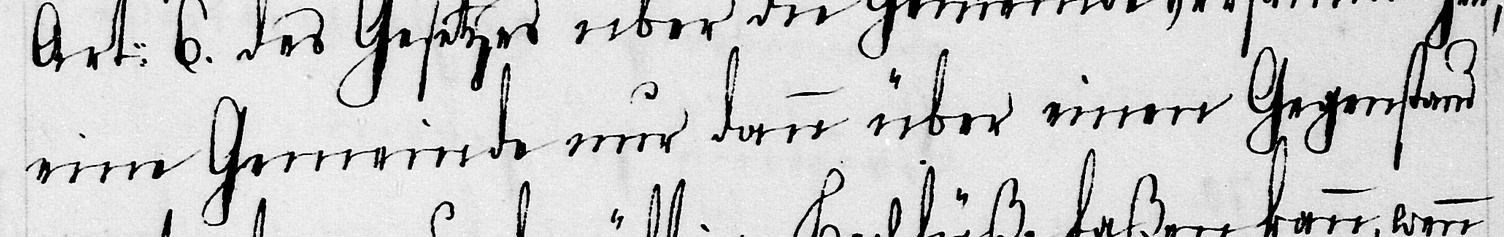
eine Gemeinde nur dann über einen Gegenstand
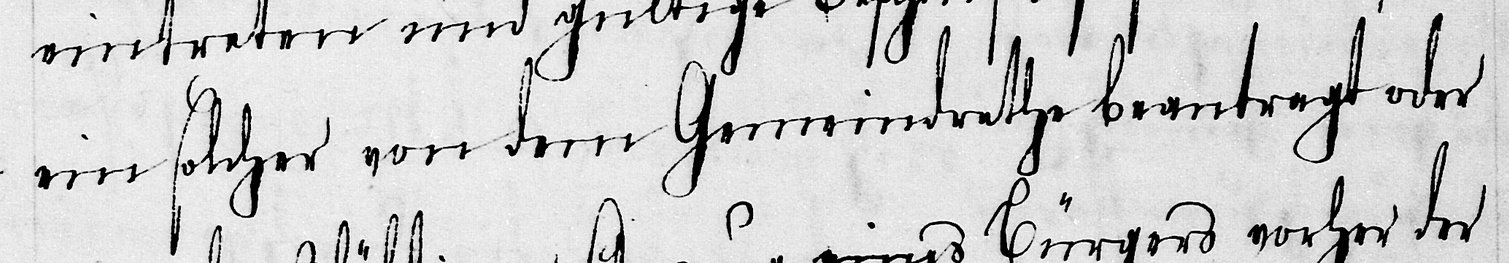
ein solcher von dem Gemeindrathe beantragt oder
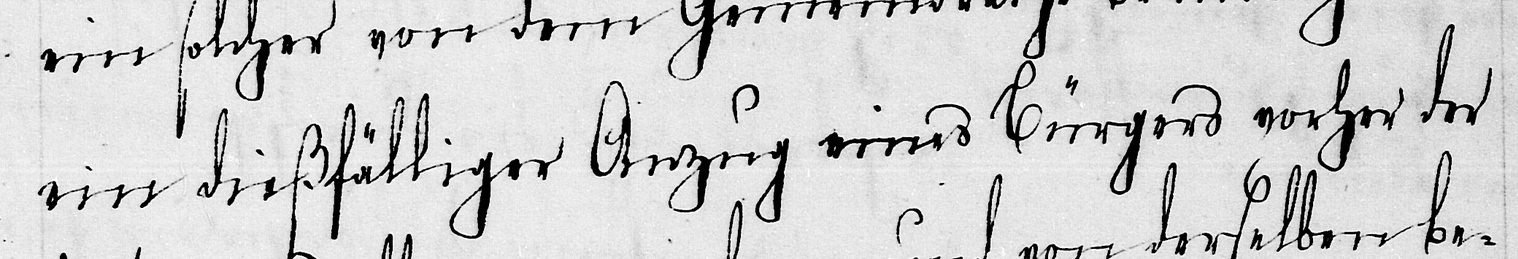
ein dießfälliger Anzug eines Bürgers vorher der
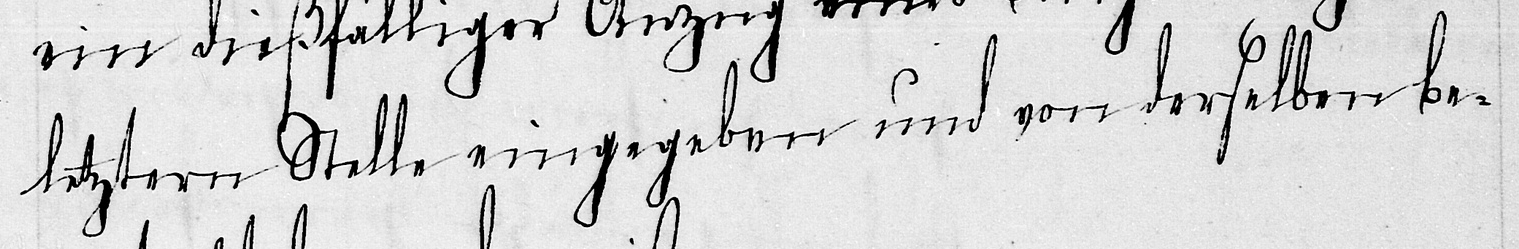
letztern Stelle eingegeben und von derselben be¬
